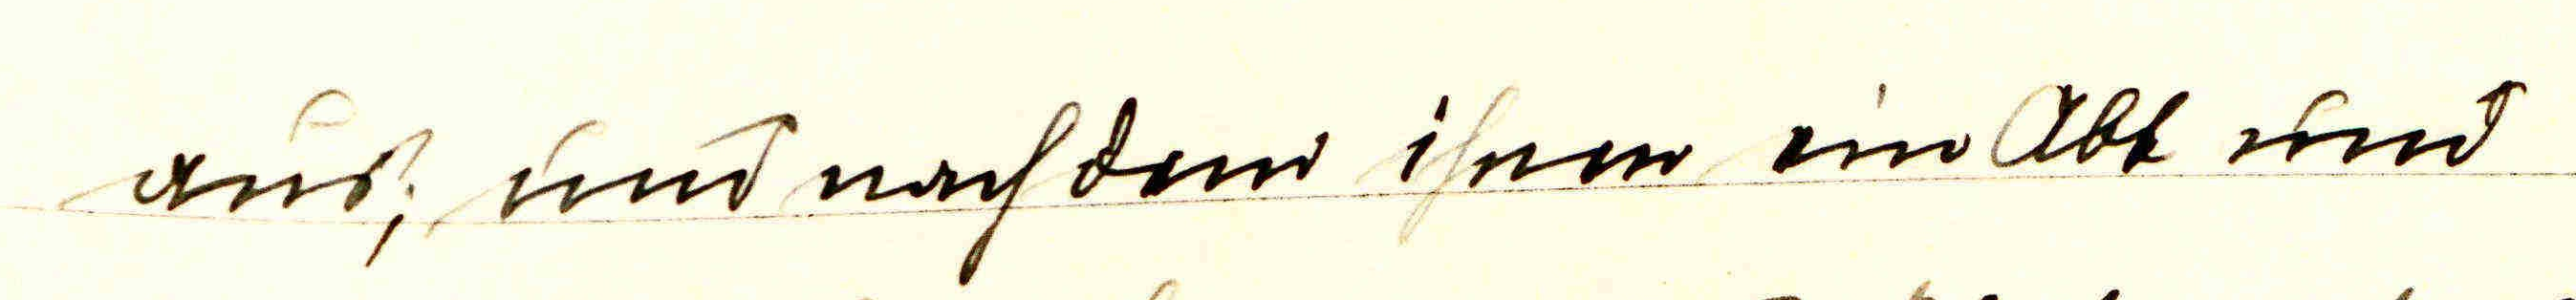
aus; und nach dem ihren ein Abt und
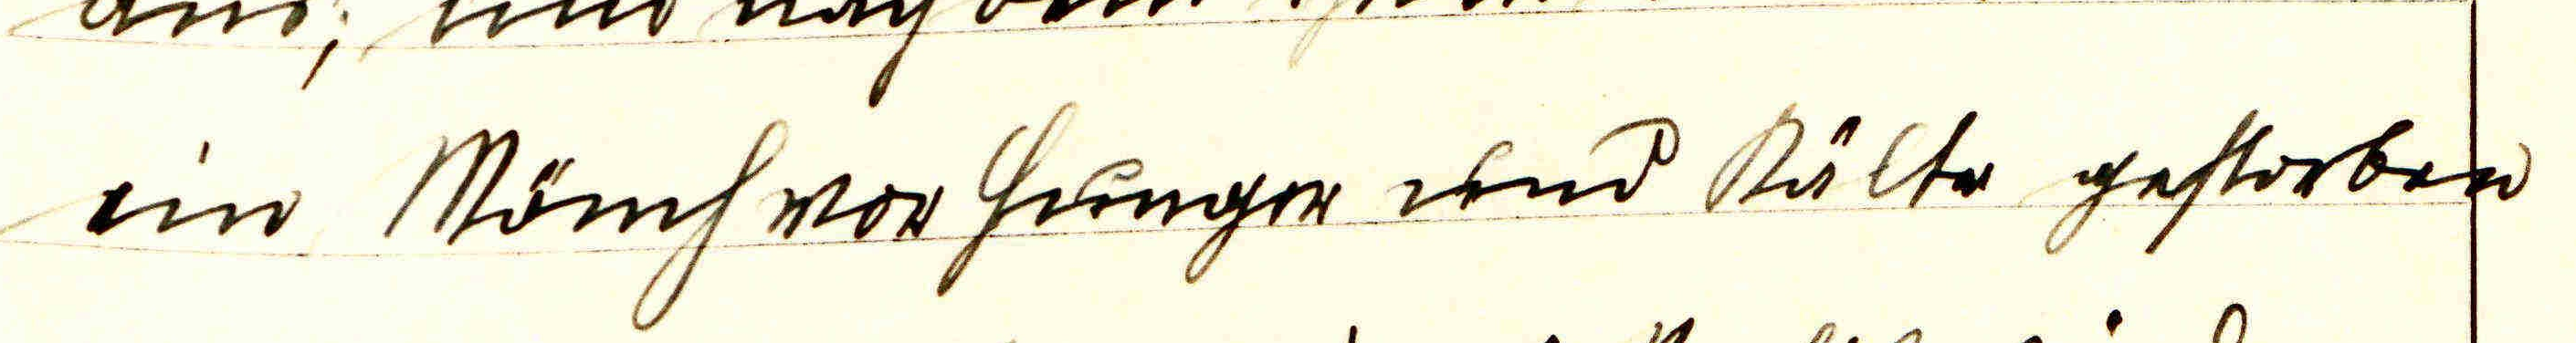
ein Mönch vor Hunger und Kälte gestorben
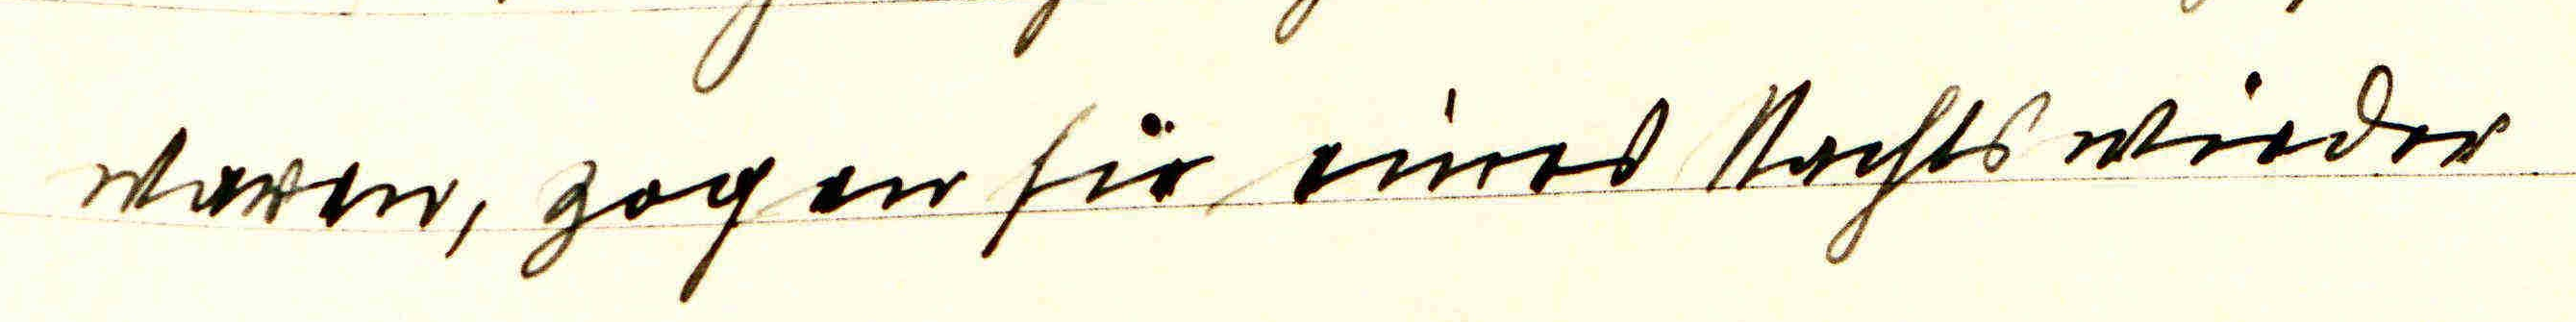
waren, zogen sie eines Nachts wieder
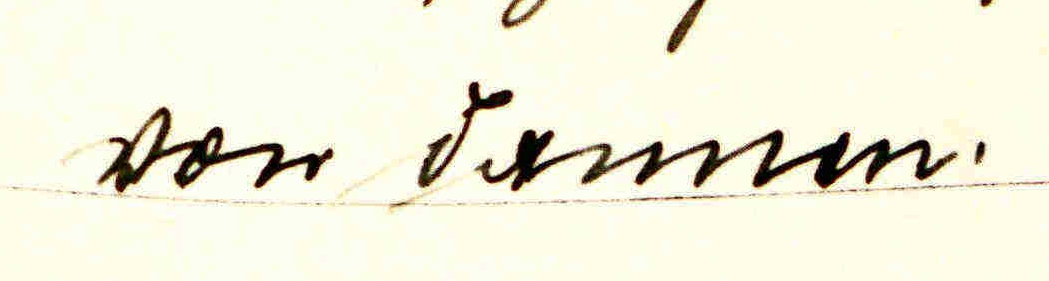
von dannen.
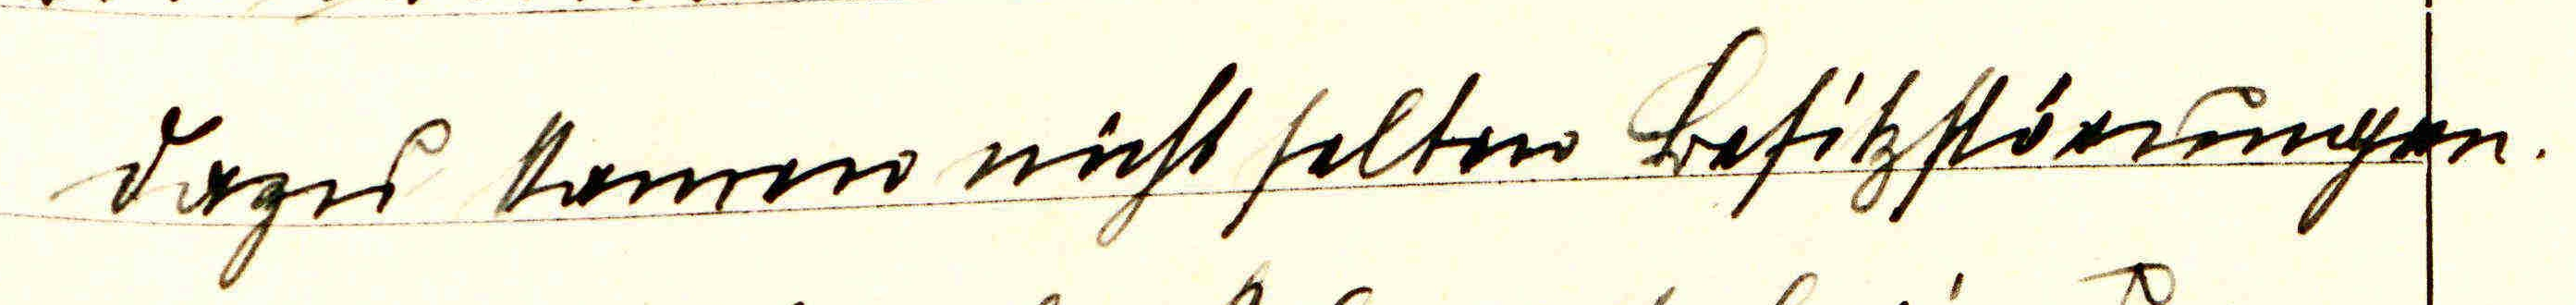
Dazu kamen nicht selten Besitzstörungen.
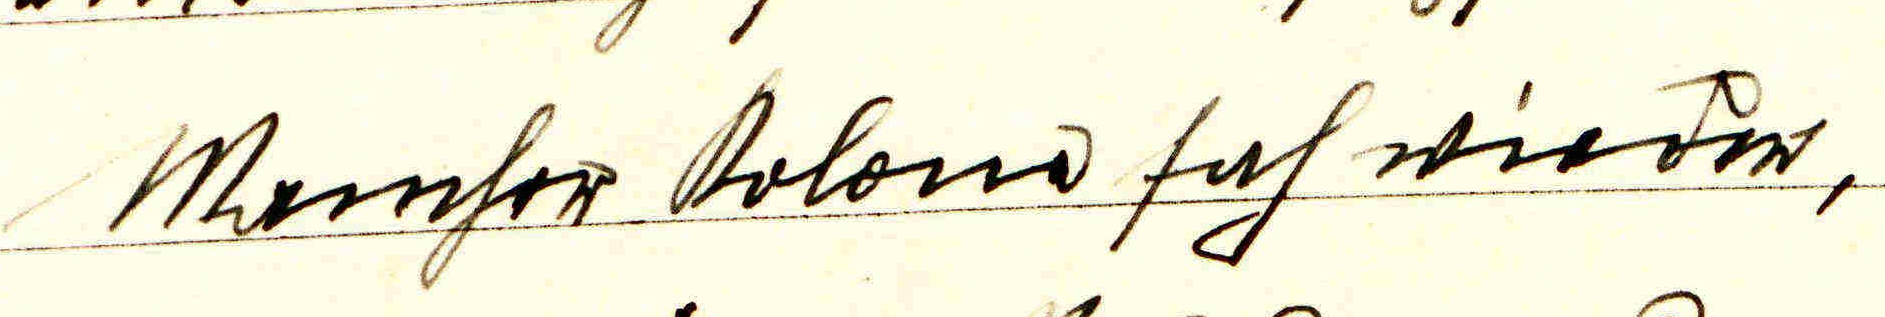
Mancher Kolone sah wieder,
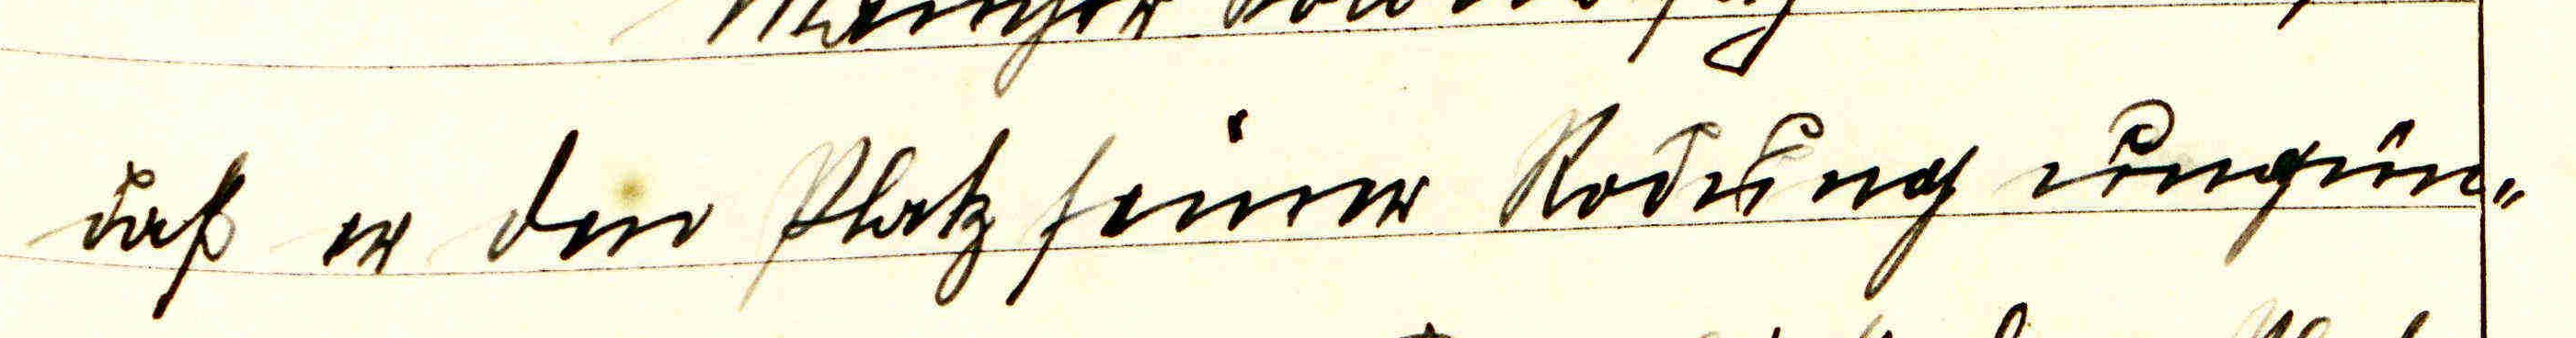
daß er den Platz seiner Rodung ungün-
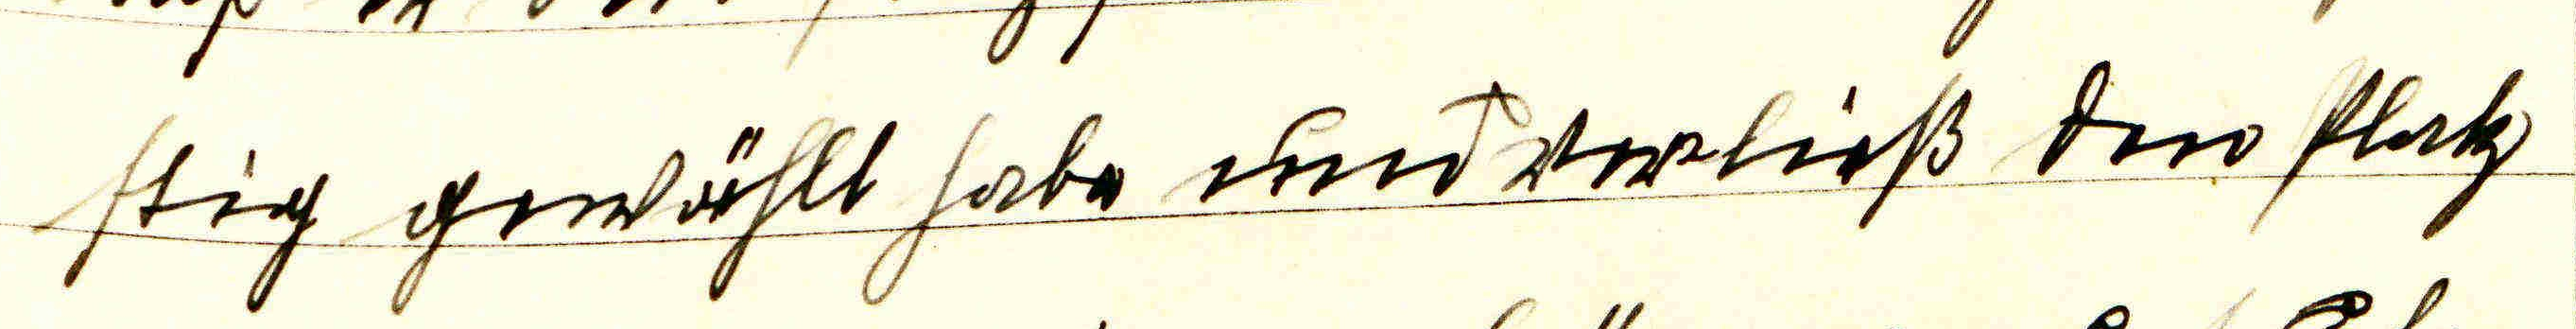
stig gewählt habe und verließ den Platz
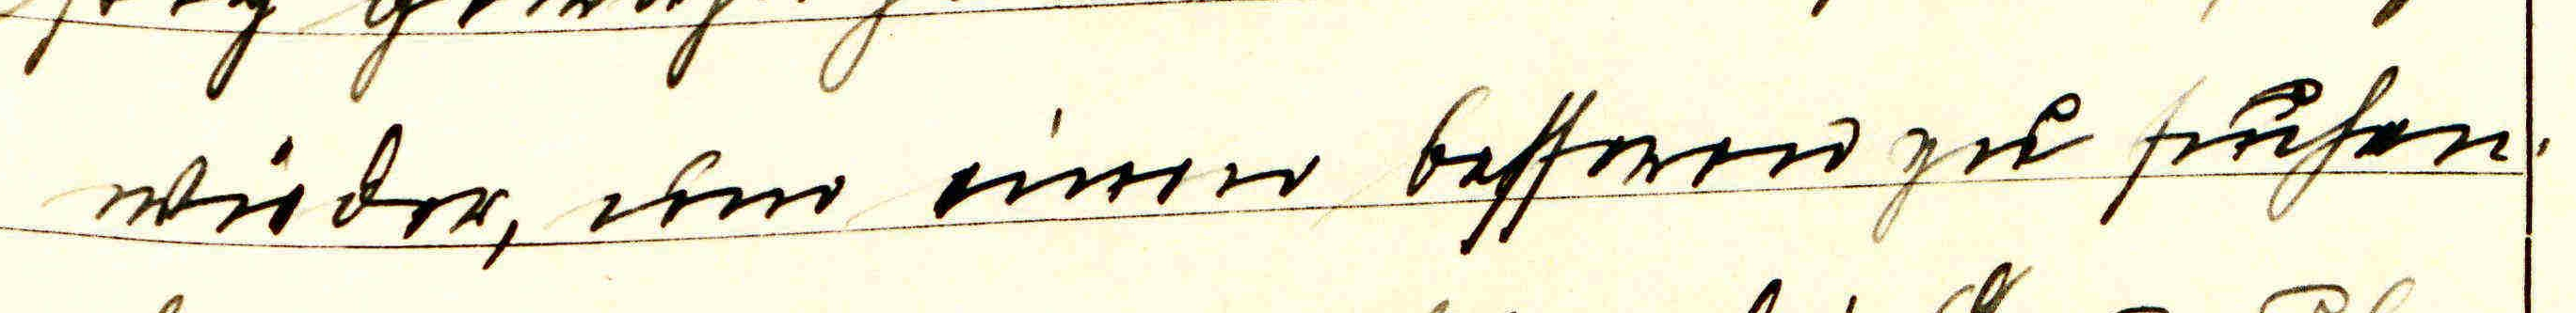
wieder, um einen Besseren zu suchen.
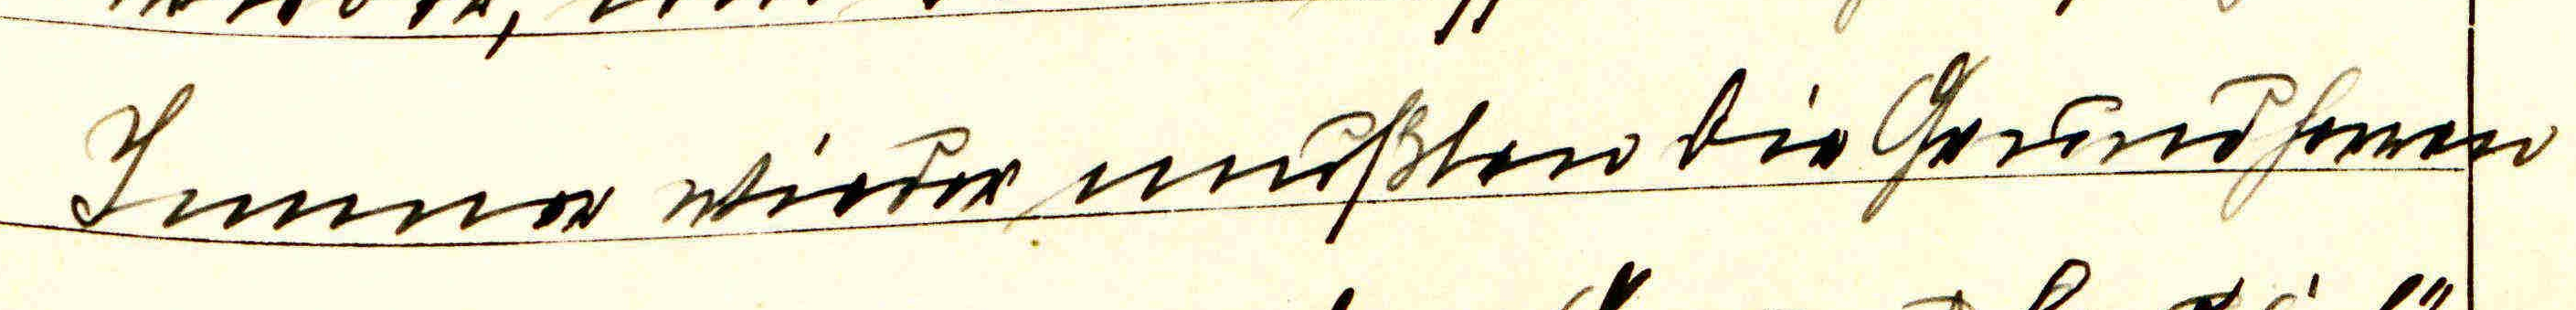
Immer wieder mußten die Grundherren
